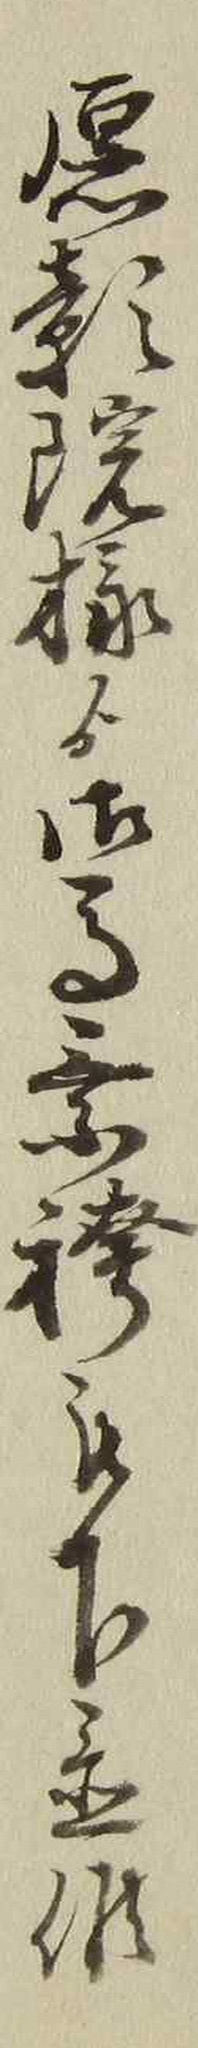愿彰院様ゟ御馬乗袴被下置候
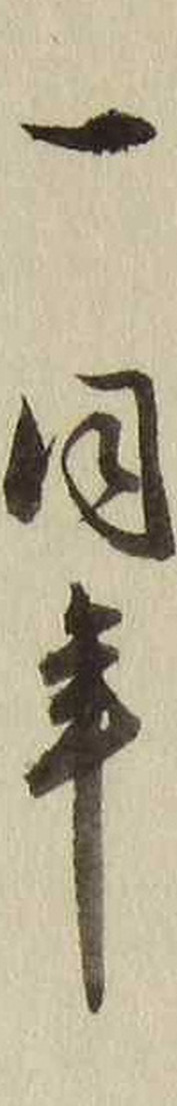一同年
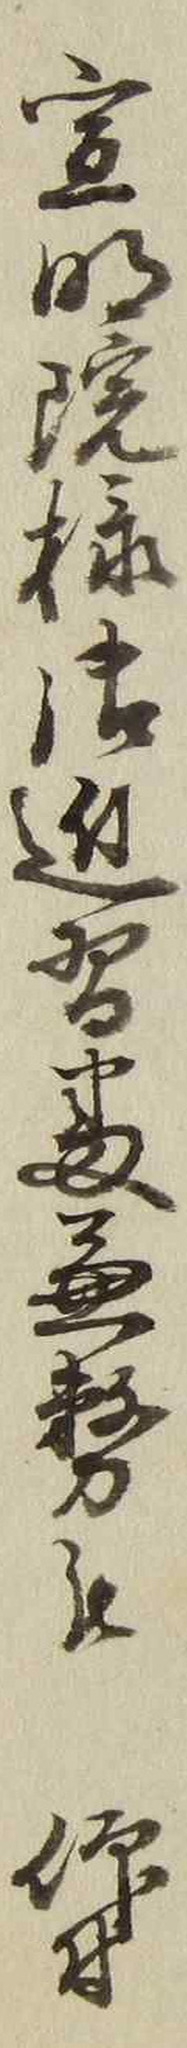宣明院様御近習番兼務被仰付

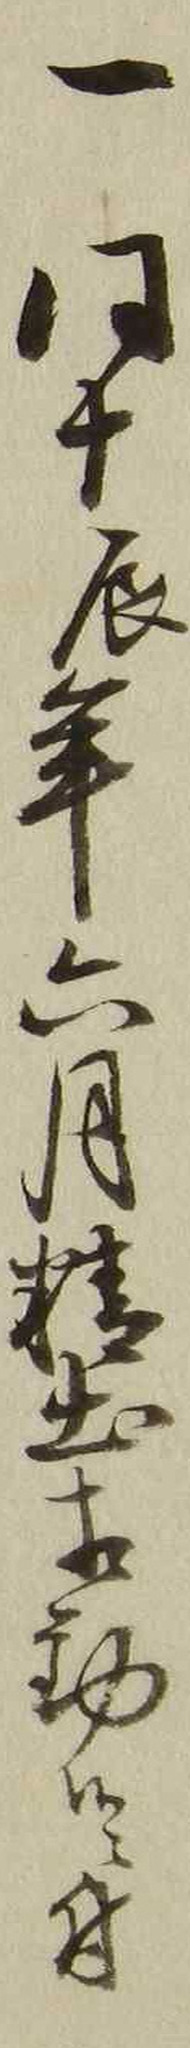一同十辰年六月精出相勤候ニ付
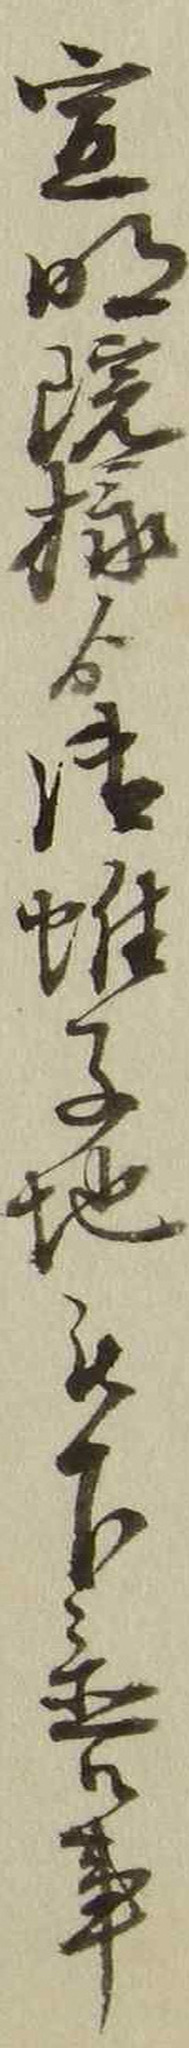宣明院様ゟ御帷子地被下置候事
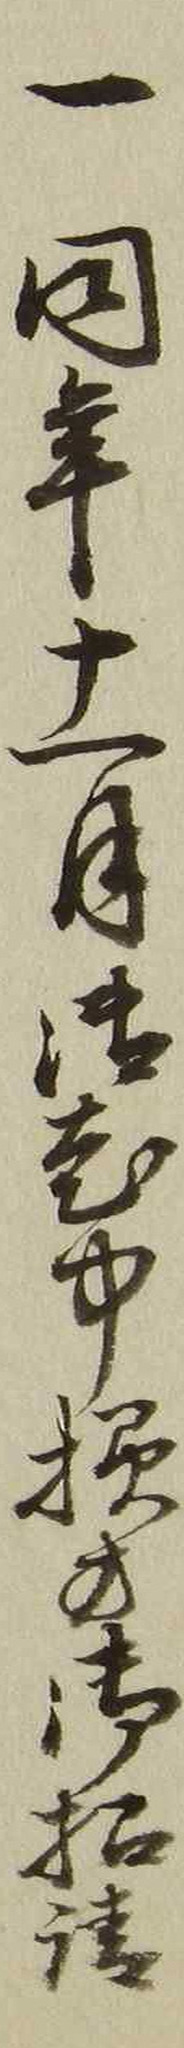一同年十一月御老中様方御招請
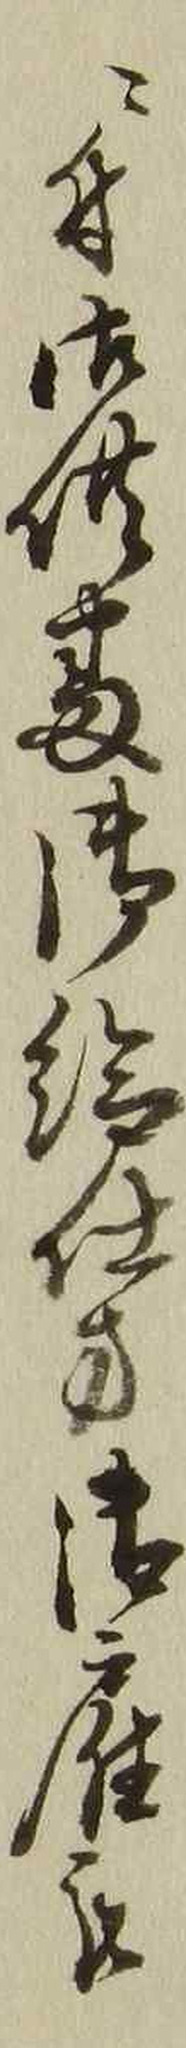ニ付御供番御給仕方御雇被
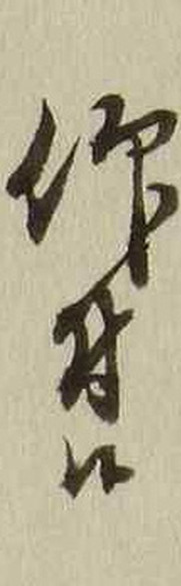仰付候
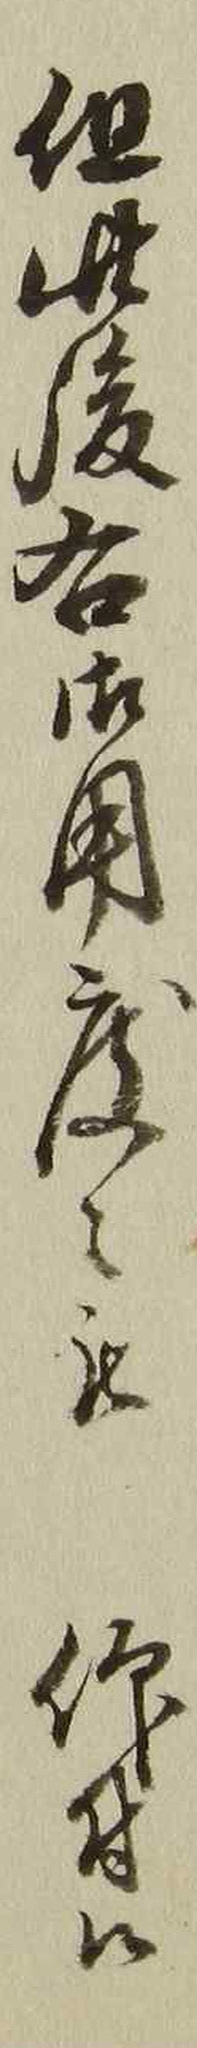但此後右御用度々被仰付候
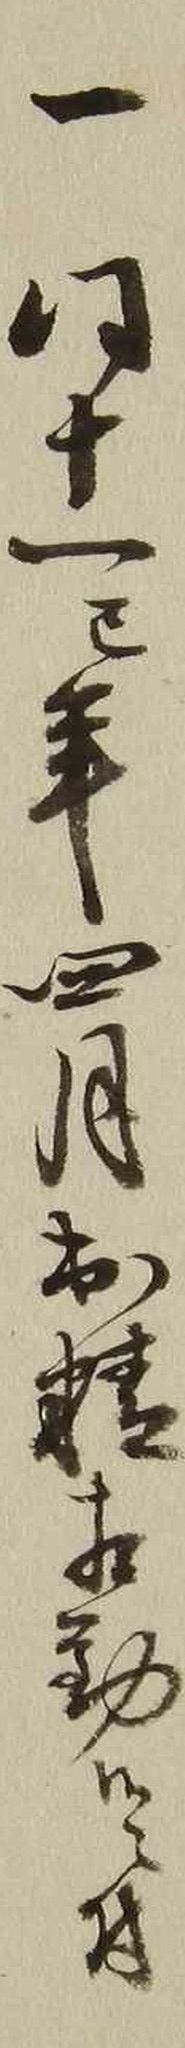一同十一巳年四月出精相勤候ニ付
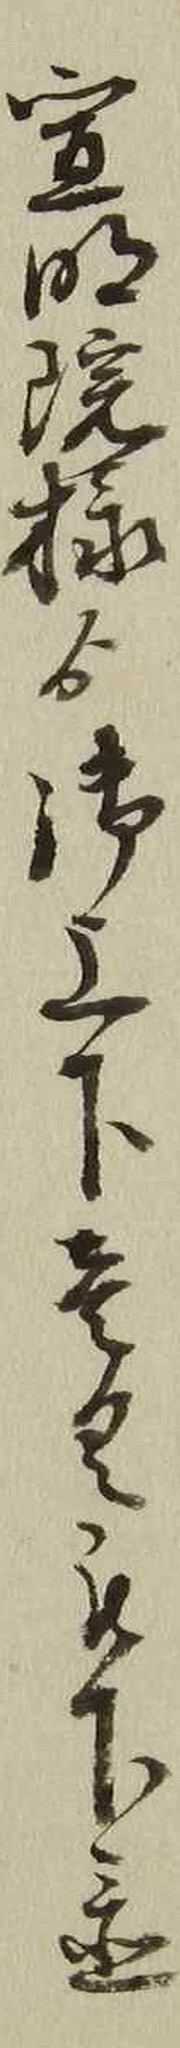宣明院様ゟ御上下壱具被下置
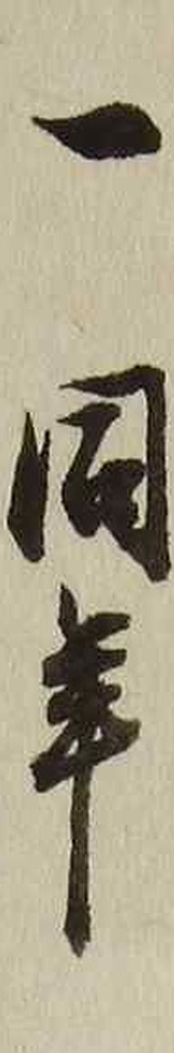一同年
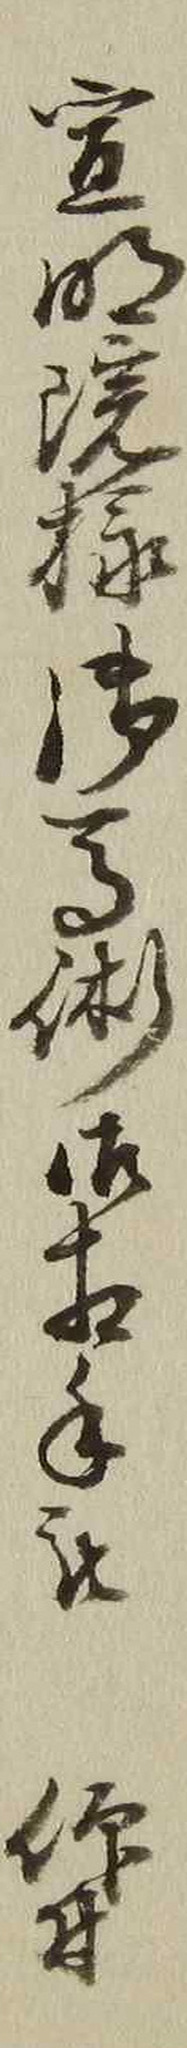宣明院様御馬術御相手被仰付
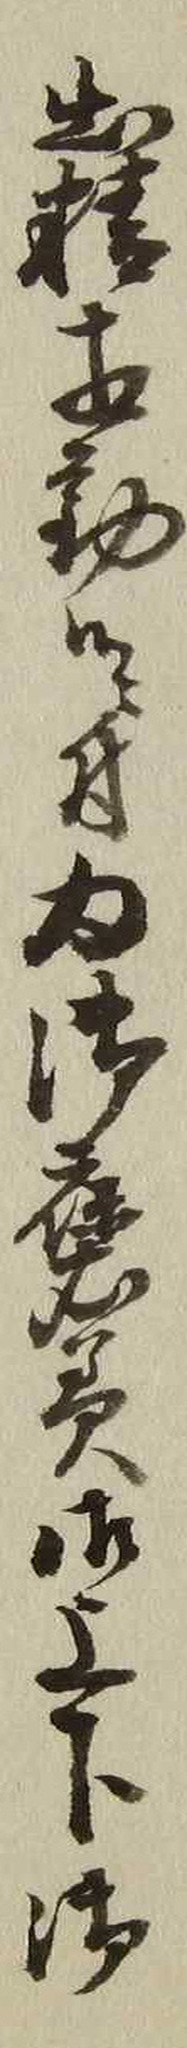出精相勤候ニ付為御褒美御上下御
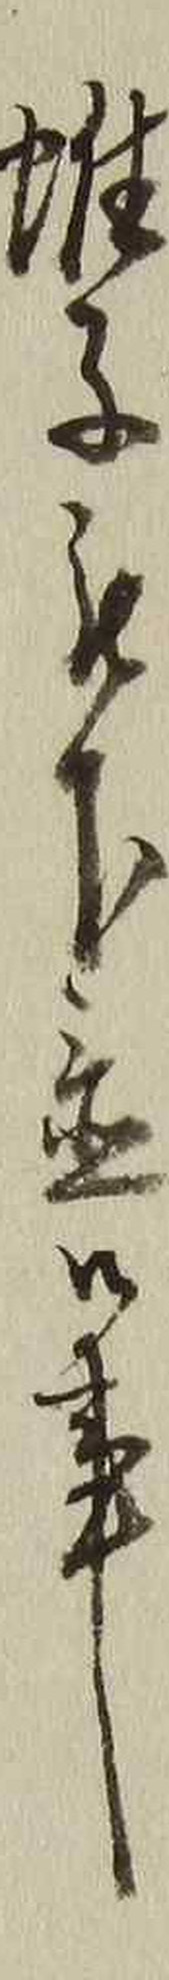帷子被下置候事
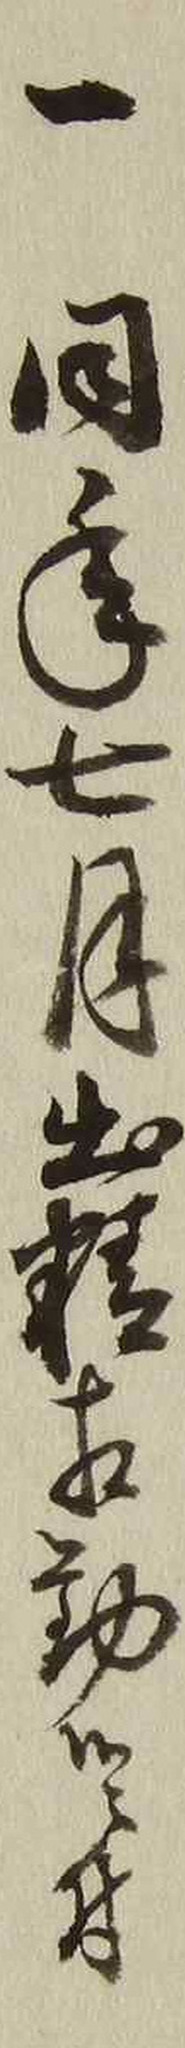一同年七月出精相勤候ニ付
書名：諸士系譜　巻之31　い之部31
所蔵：会津若松市立会津図書館
